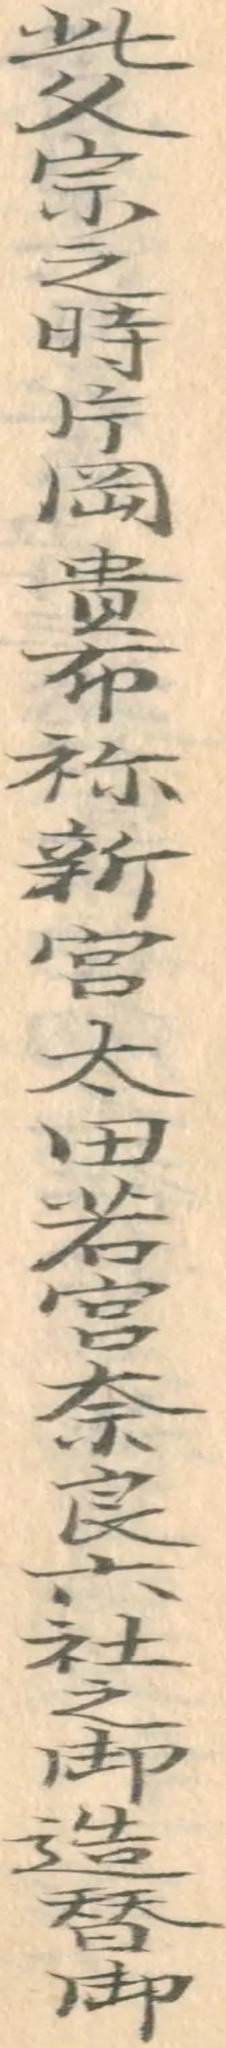此久宗之時片岡貴布祢新宮太田若宮奈良六社之御造替御
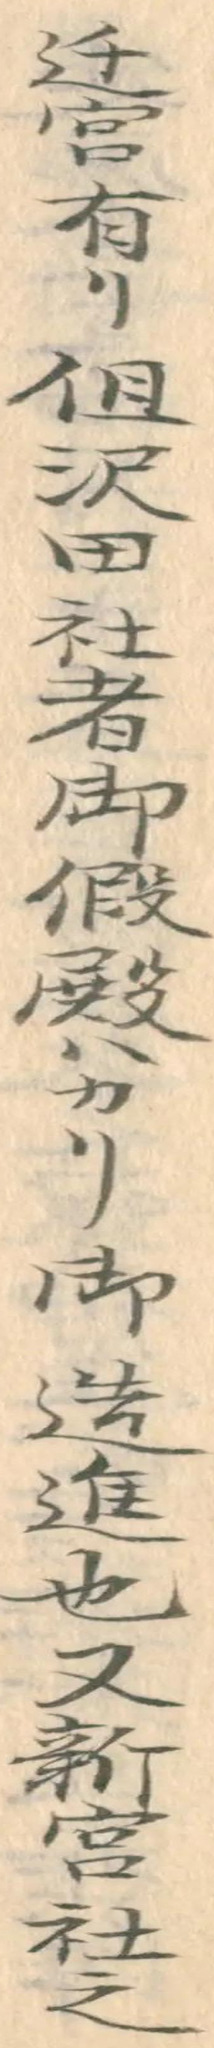遷宮有リ但沢田社者御仮殿ハカリ御造進也又新宮社之
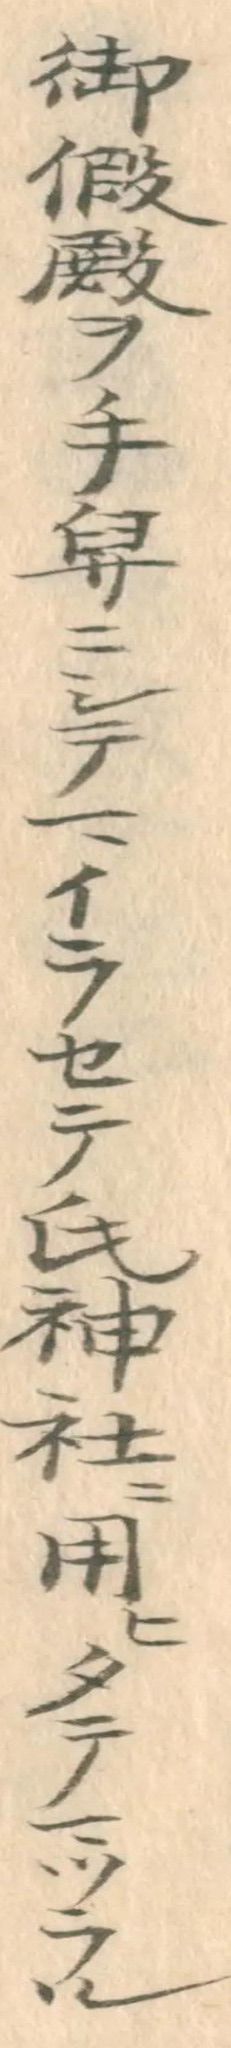御仮殿ヲ手舁ニシテマイラセテ氏神社ニ用ヒタテマツラル
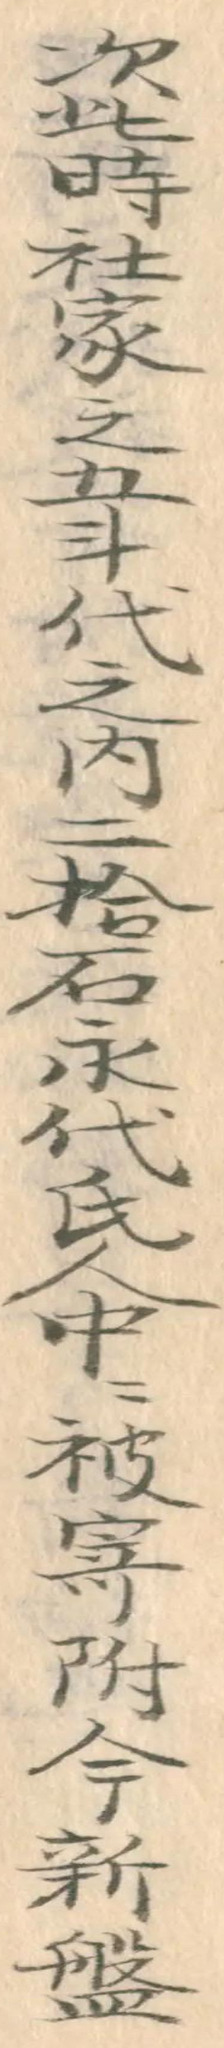次此時社家之五斗代之内二拾石永代氏人中ニ被寄附今新盤
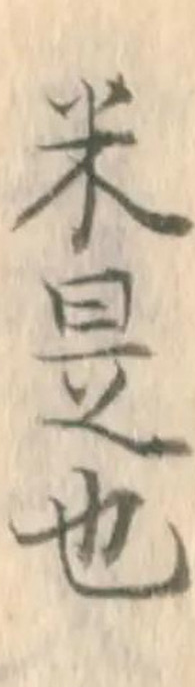米是也
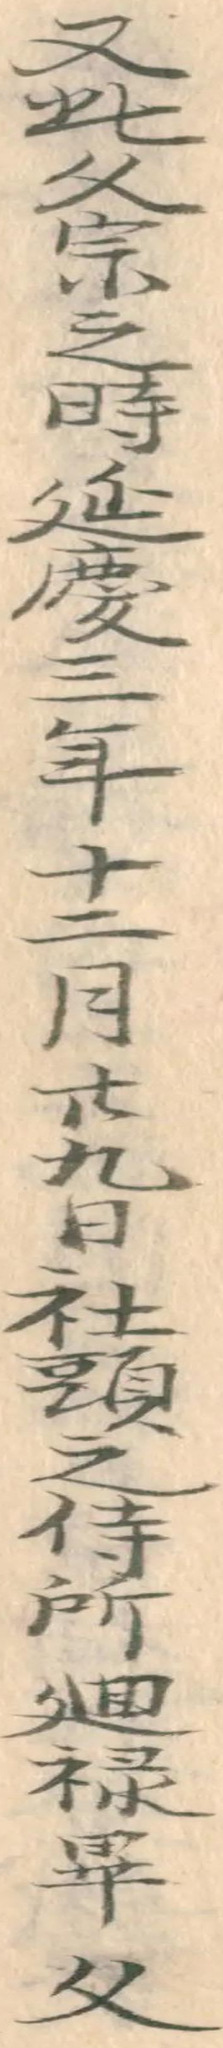又此久宗之時延慶三年十二月廿九日社頭之侍所廻禄畢久
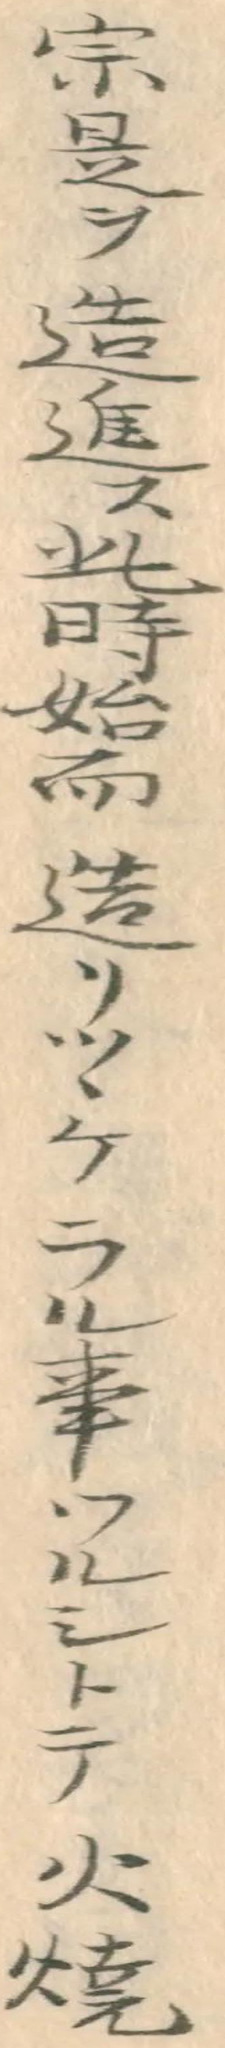宗是ヲ造進ス此時始而造リツヽケラル事ワルシトテ火焼
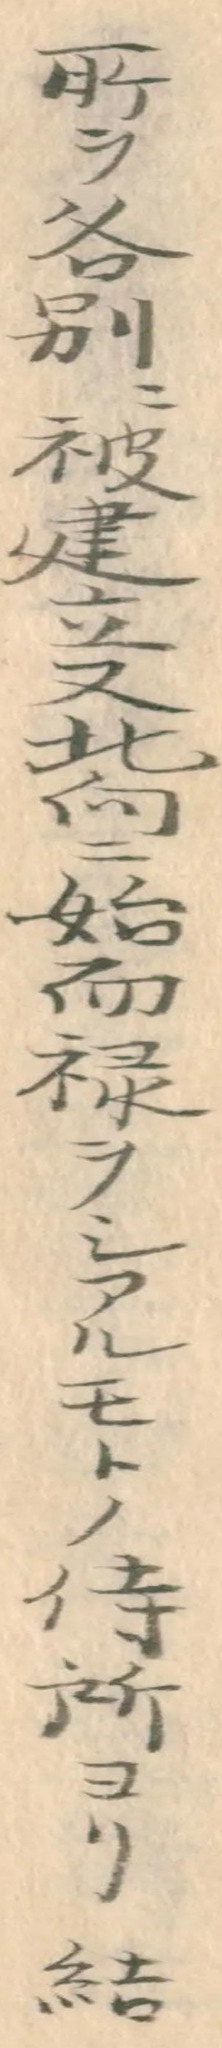所ヲ各別ニ被建立又北向ニ始而禄ヲシアルモトノ侍所ヨリ結
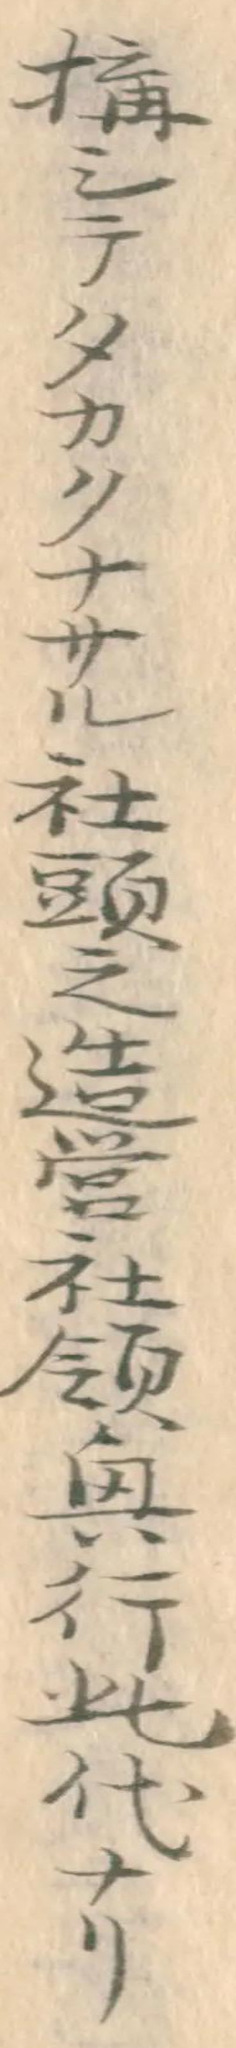構シテタカクナサル社頭之造営社領興行此代ナリ
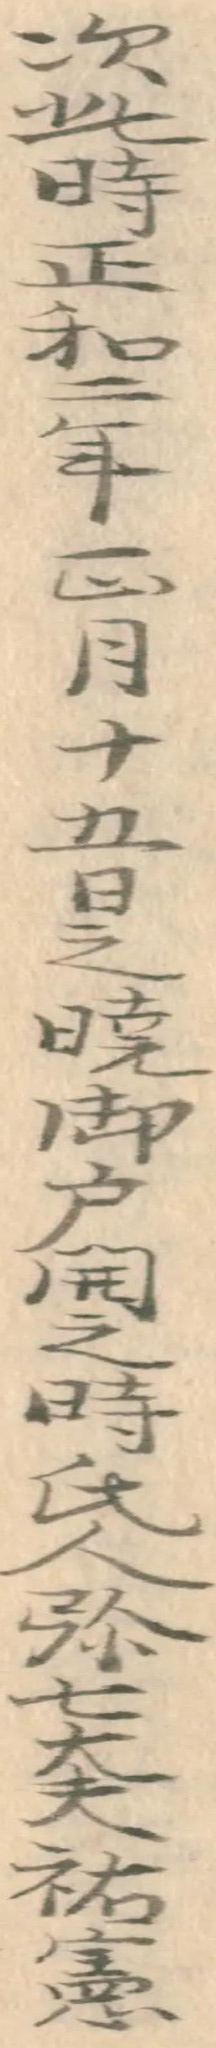次此時正和二年正月十五日之暁御戸開之時氏人弥七大夫祐憲
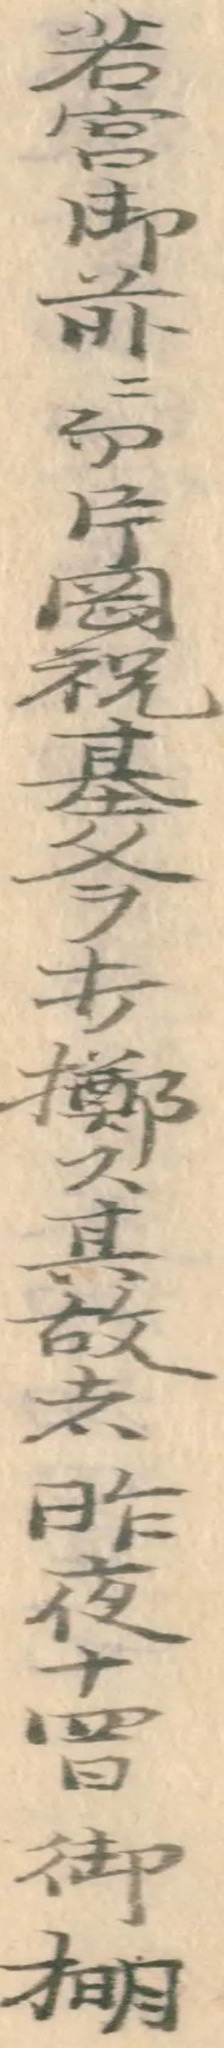若宮御前ニ而片岡祝基久ヲ打擲ス其故者昨夜十四日御棚
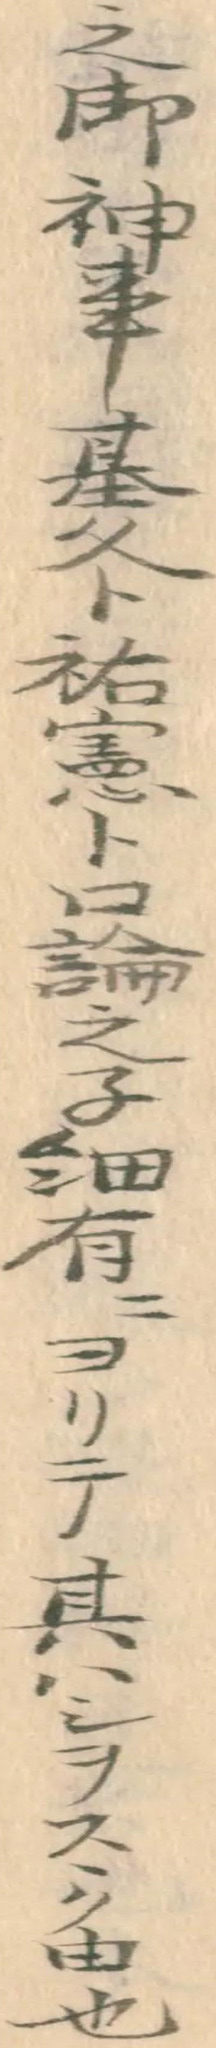之御神事基久ト祐憲ト口論之子細有ニヨリテ其ハシヲスヽク由也
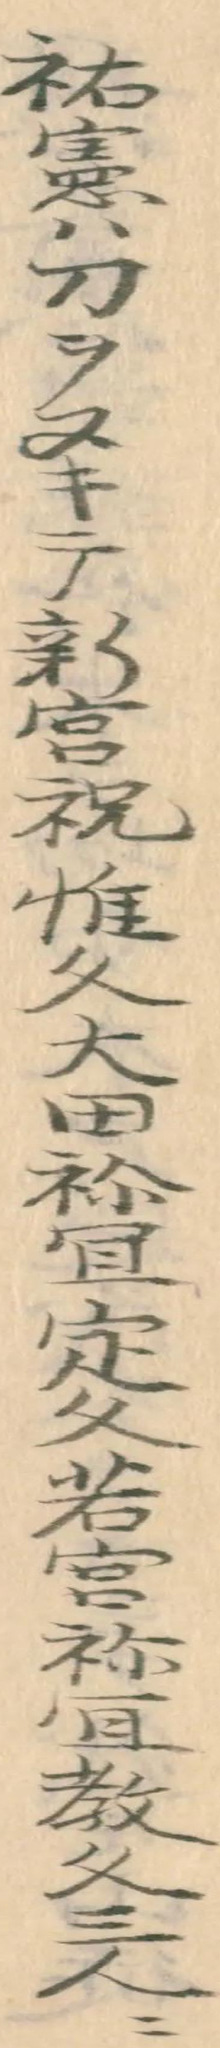祐憲ハ刀ヲヌキテ新宮祝惟久大田祢宜定久若宮祢宜教久三人ニ
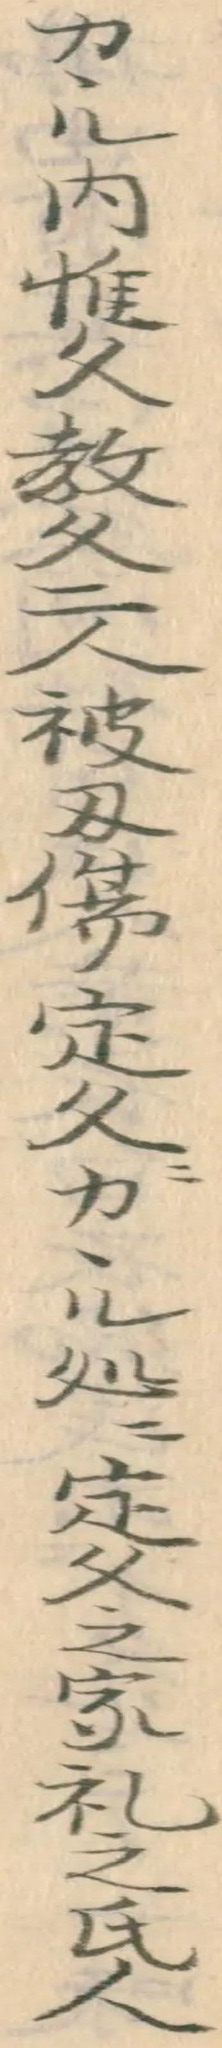カヽル内惟久教久二人被刃傷定久ニカヽル処ニ定久之家礼之氏人
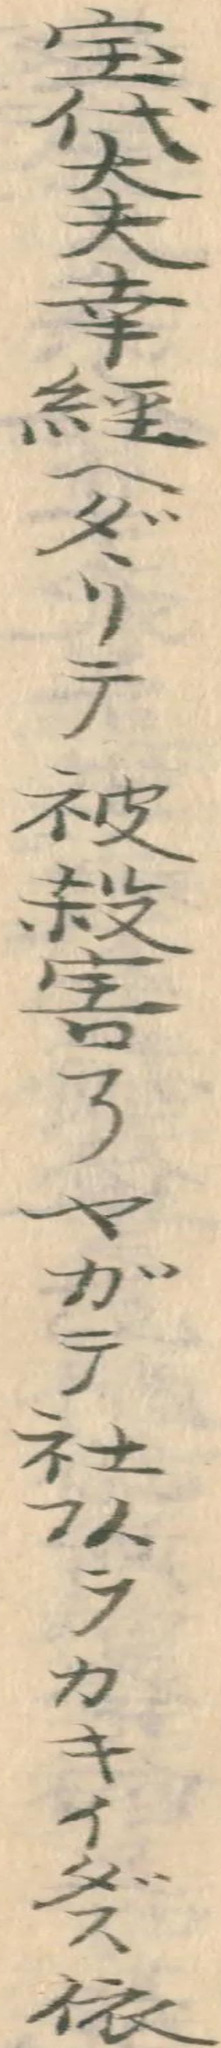宝代大夫幸経ヘダヽリテ被殺害了ヤガテ社頭ヲカキイダス依
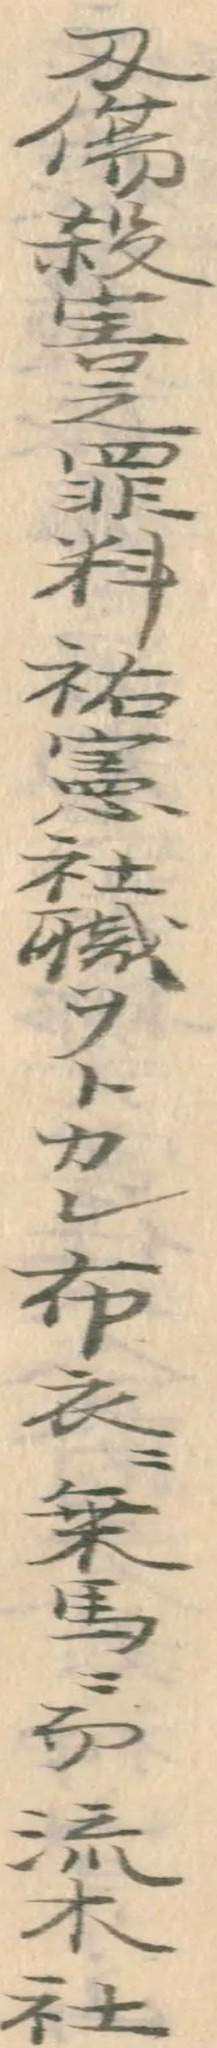刃傷殺害之罪料祐憲社職ヲトカレ布衣ニ乗馬ニ而流木社
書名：賀茂社記録. 第24冊
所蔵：国立国会図書館 National Diet Library, JAPAN
